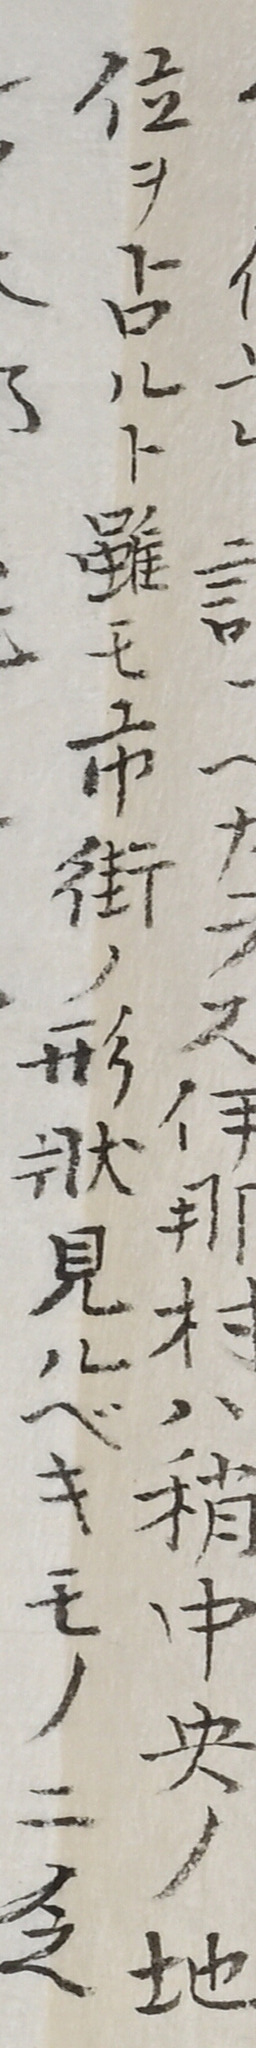位ヲト占ルト雖モ市街ノ形状見ルベキモノニ乏
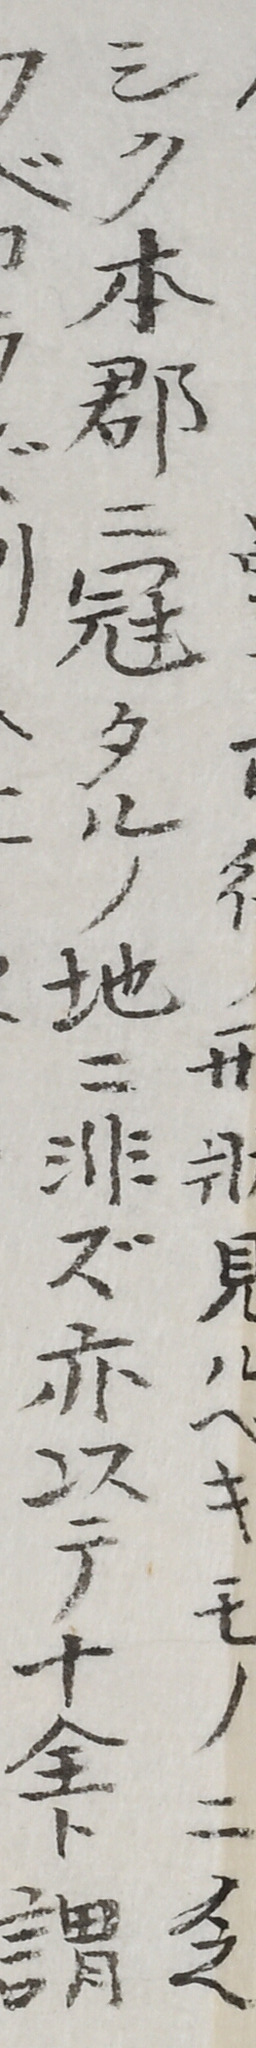シク本郡ニ冠タルノ地ニ非ズ亦以テ十全ト謂
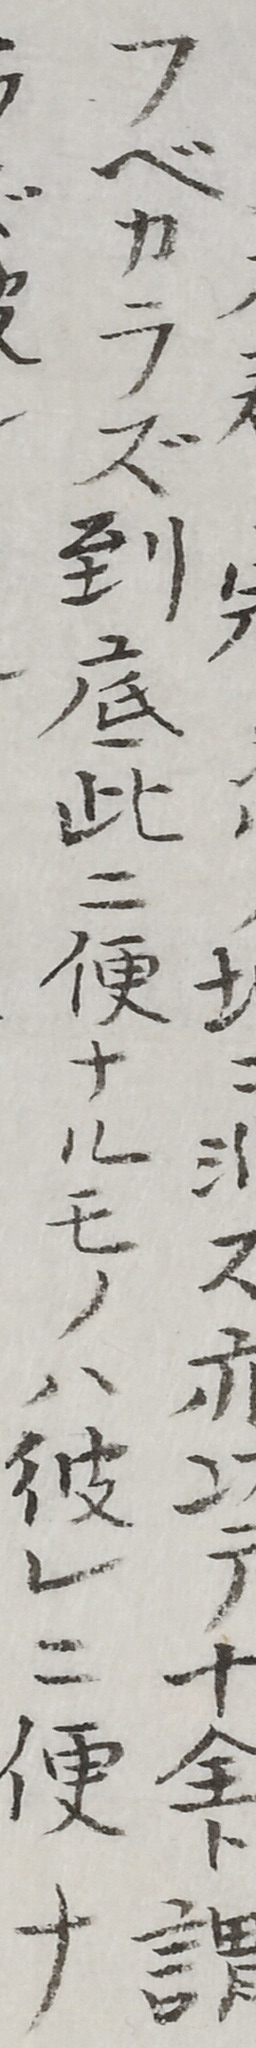フベカラズ到底此ニ便ナルモノハ彼レニ便ナ
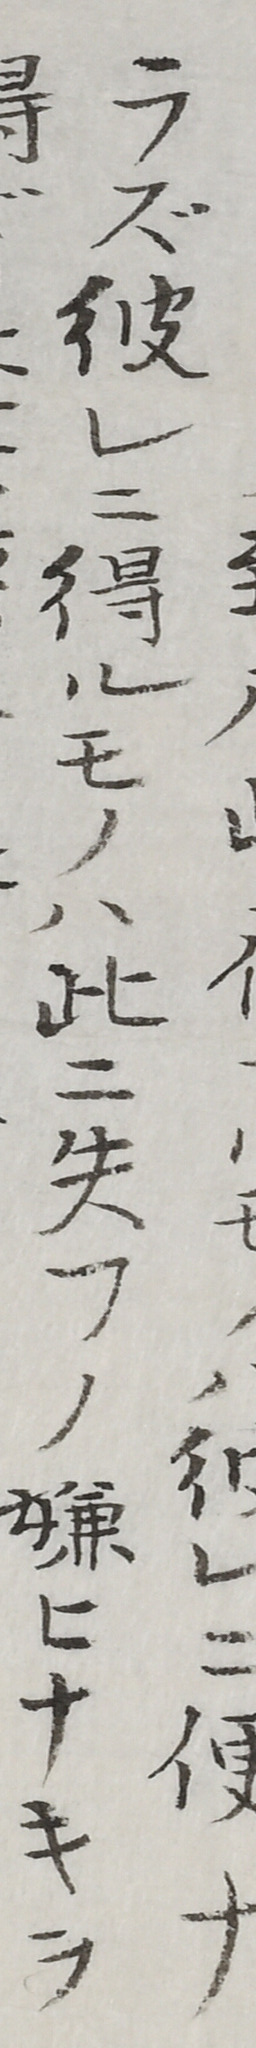ラズ彼レニ得ルモノハ此ニ失フノ嫌ヒナキヲ
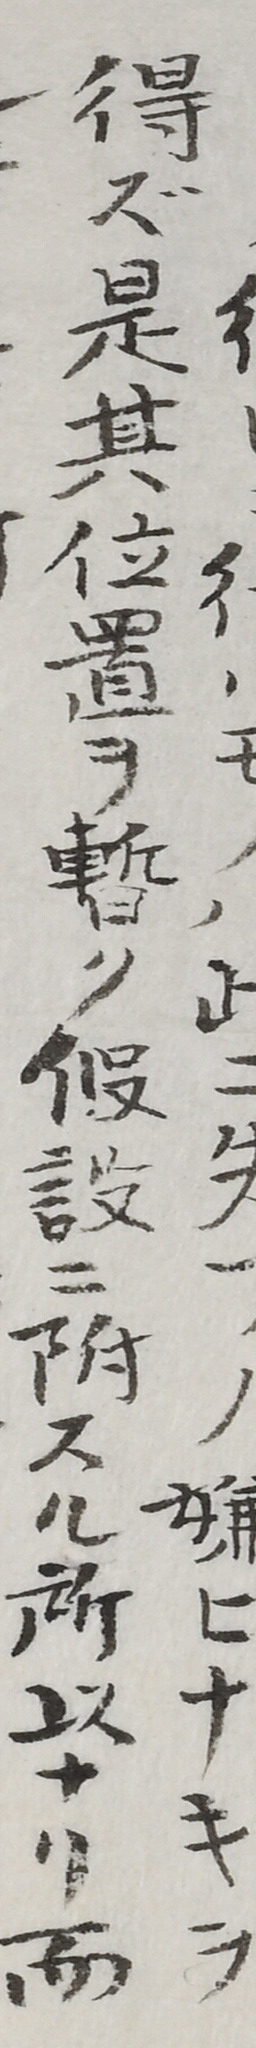得ズ是其位置ヲ暫ク仮設ニ附スル所以ナリ而
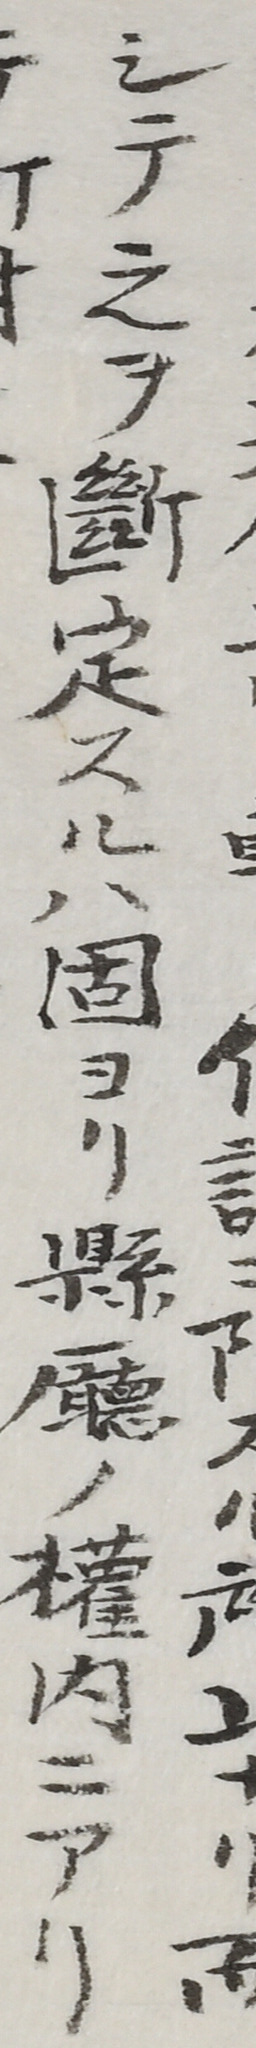シテ之ヲ断定スルハ固ヨリ県庁ノ権内ニアリ
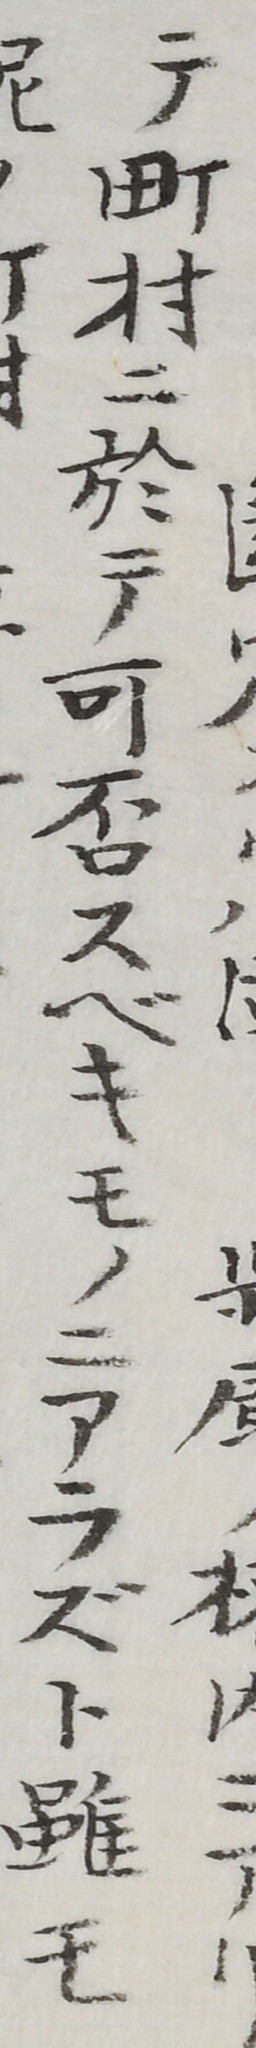テ町村ニ於テ可否スベキモノニアラズト雖モ
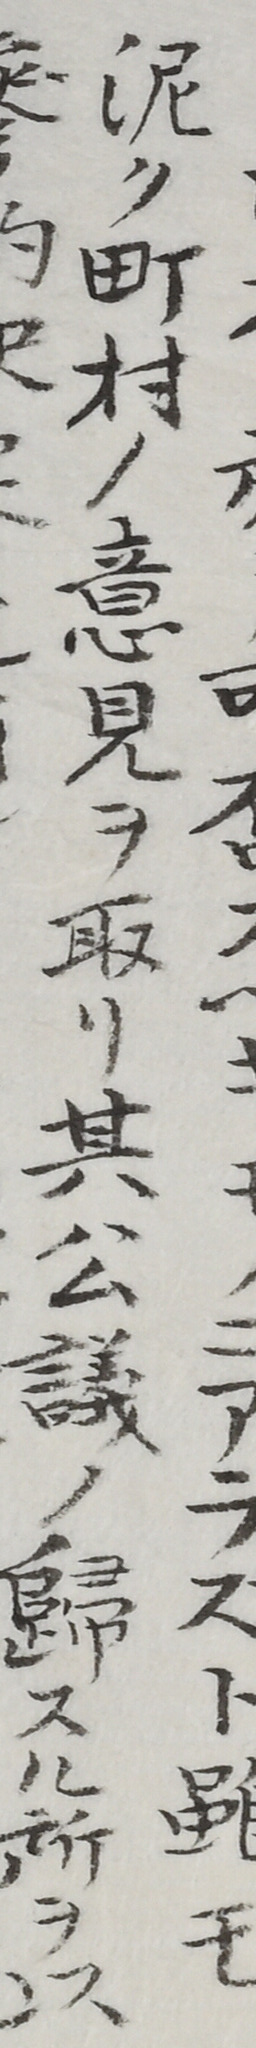泥ク町村ノ意見ヲ取リ其公議ノ帰スル所ヲ以
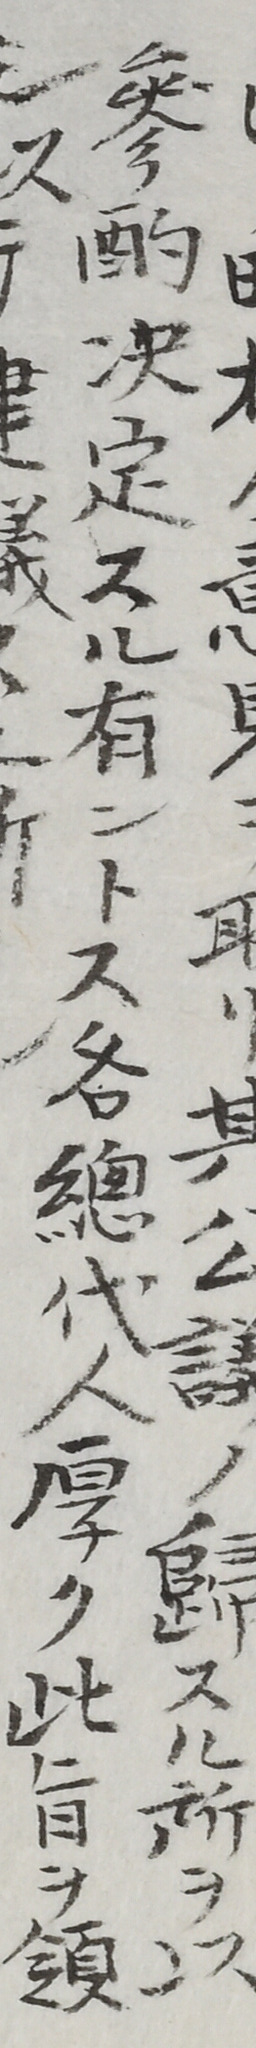参酌決定スル有ントス各総代人厚ク此旨ヲ領
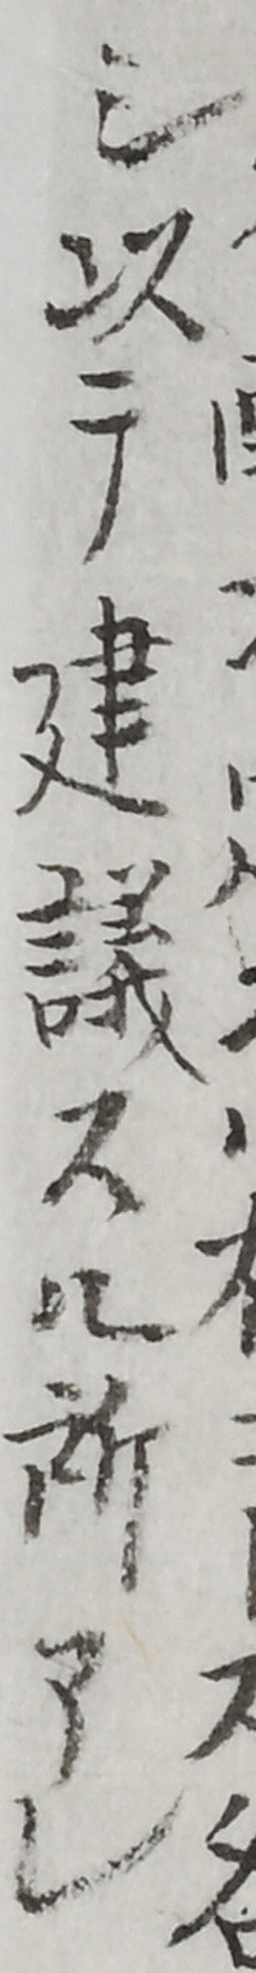シ以テ建議スル所アレ

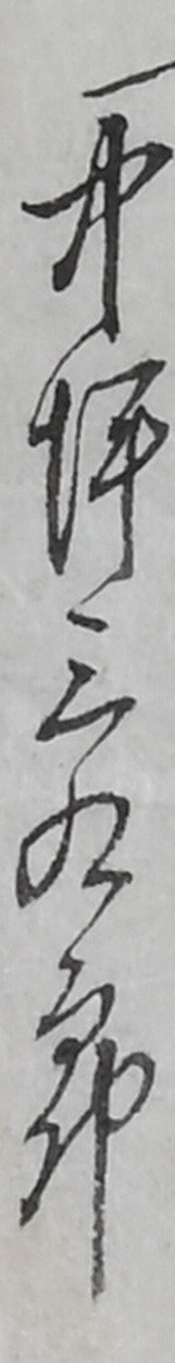中坪三九郎
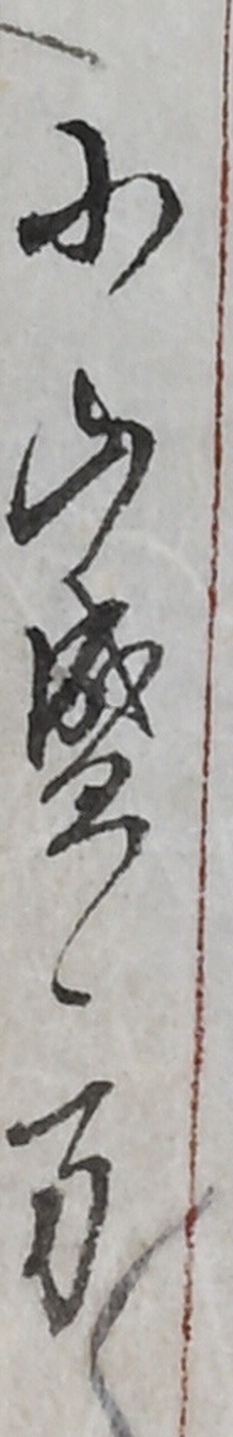小山盛方
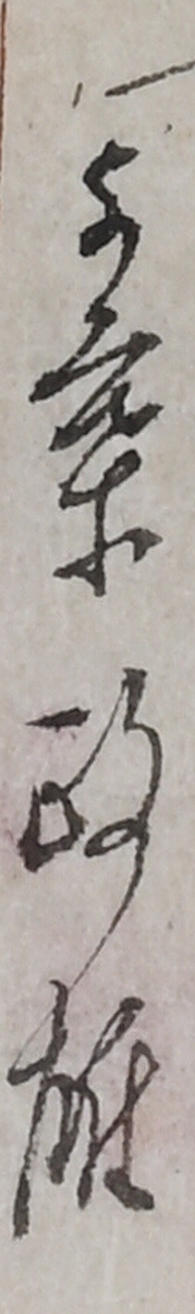千葉政雄
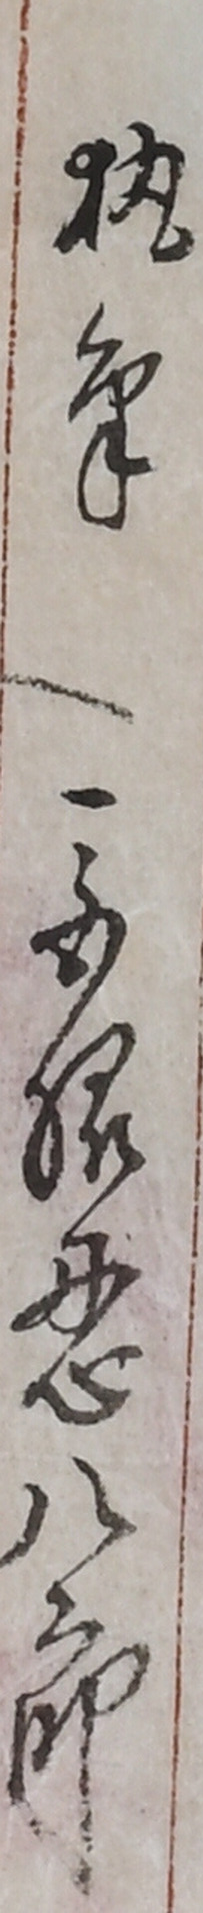執筆宮脇忍八郎
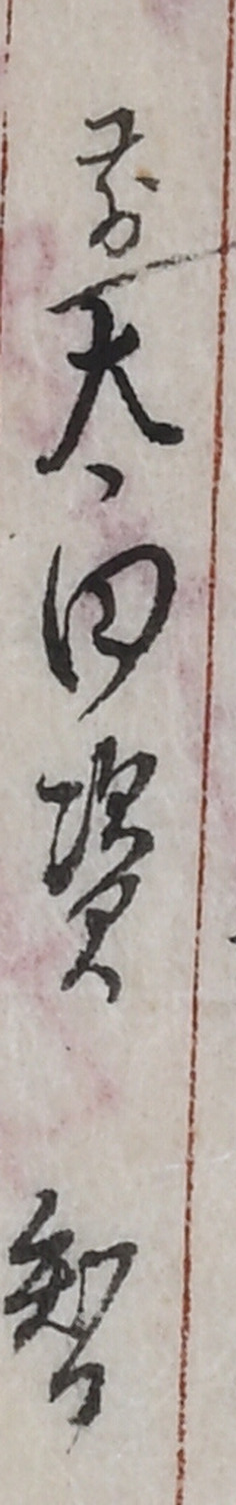前太田資智
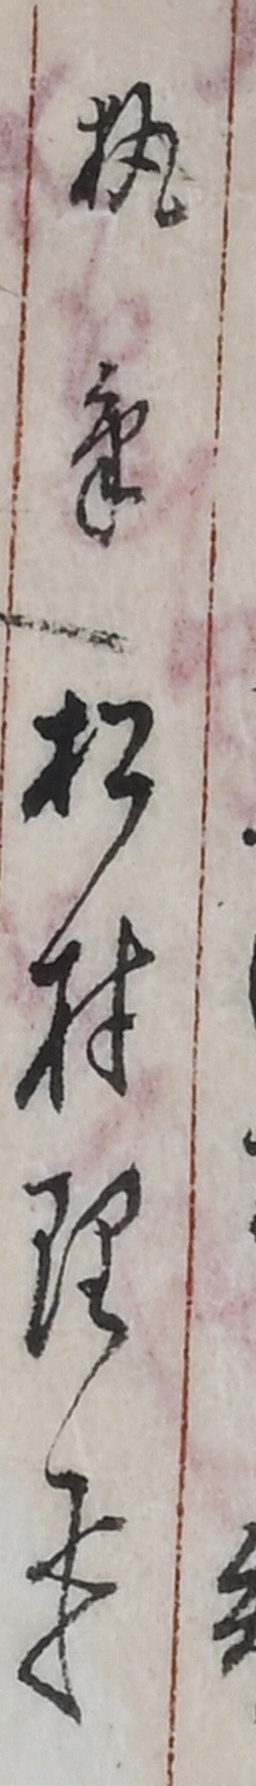一執筆松村理平
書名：郡役所勤務中御用抜書
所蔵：伊那市立高遠町図書館・合同会社AMANE
